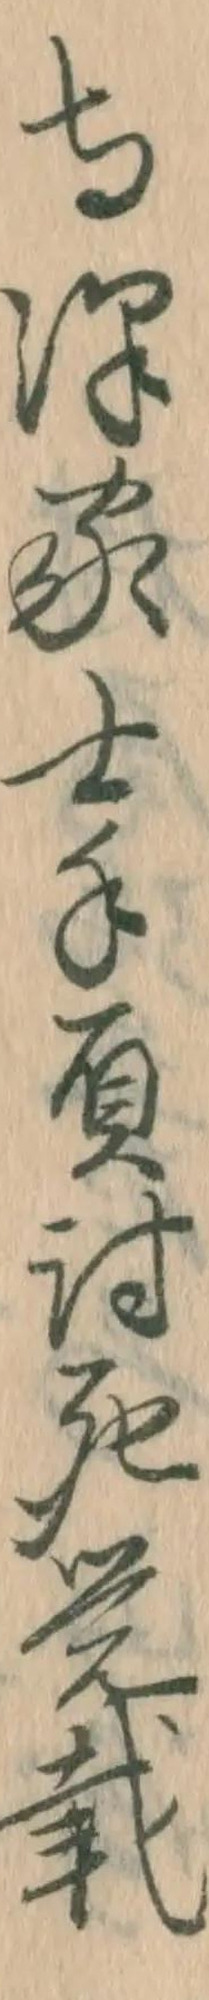寺沢家士手負討死覚載
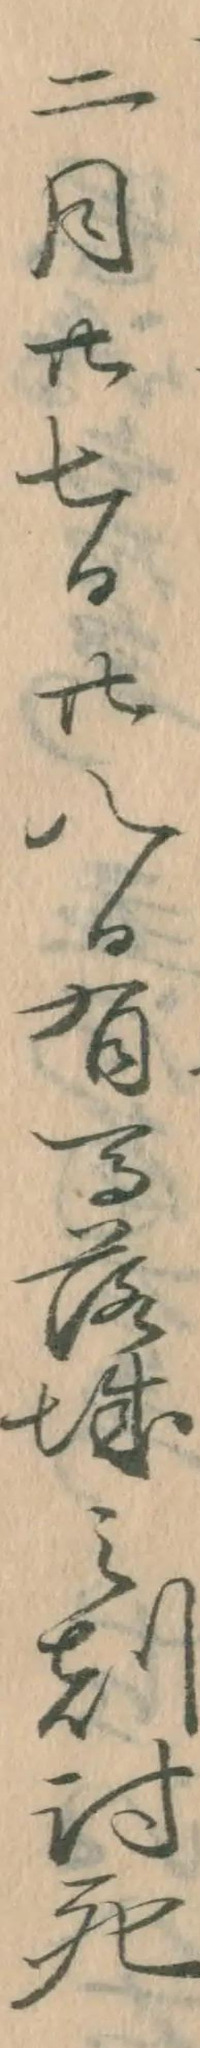二月廿七日廿八日有馬落城之刻討死

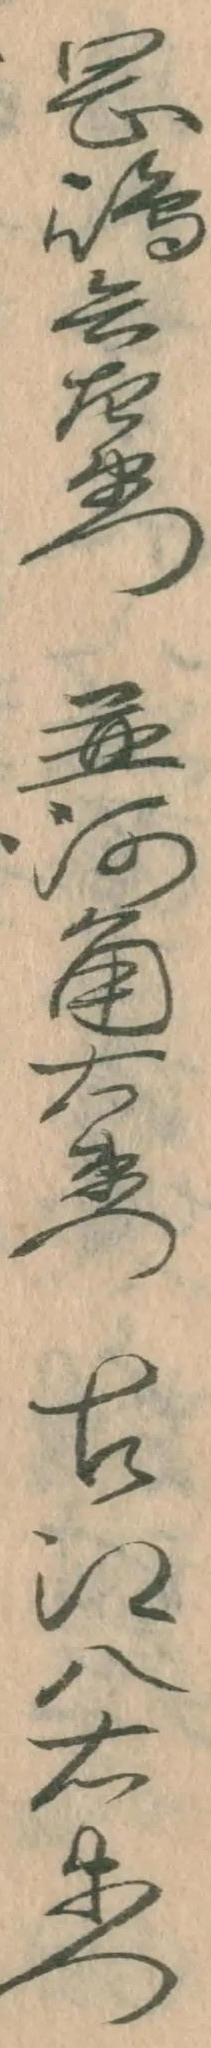岡島兵左衛門並河角右衛門古江八右衛門
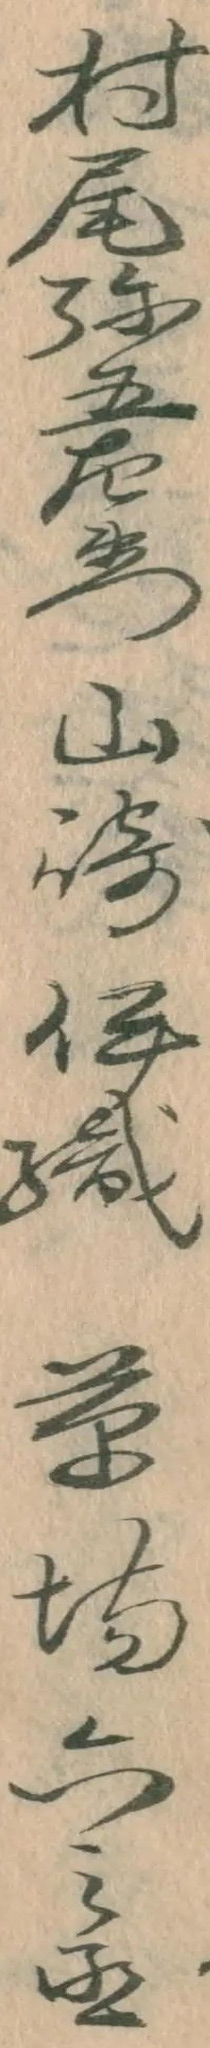村尾弥五左衛門山崎伊織草場六之丞
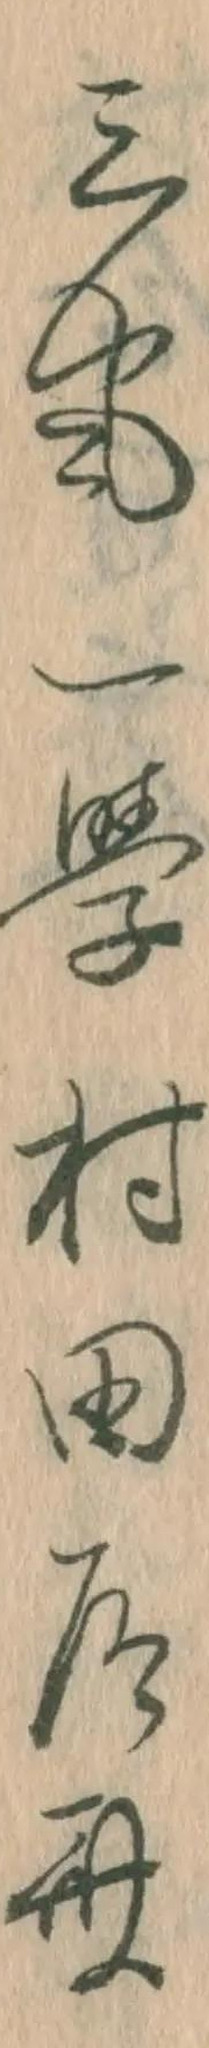三宅一学村田道斎
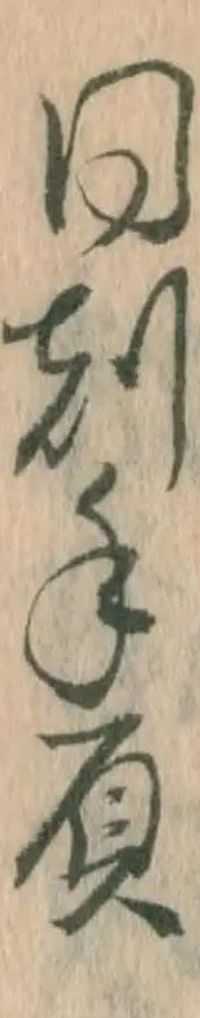同刻手負
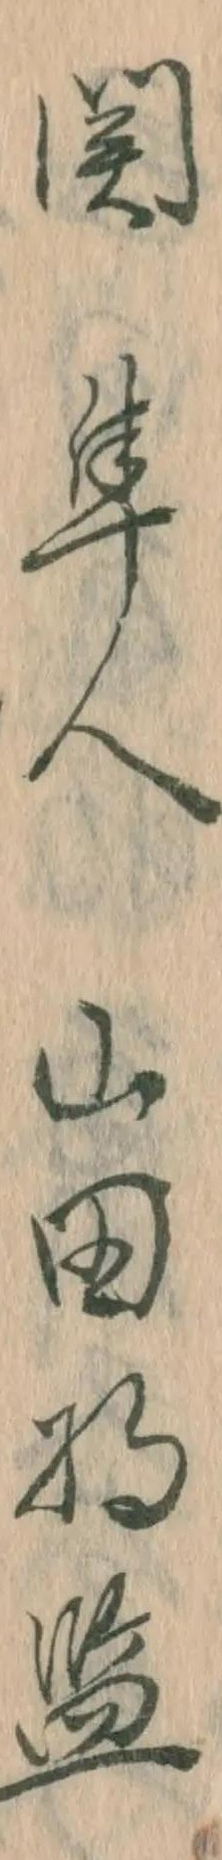関隼人山田将監
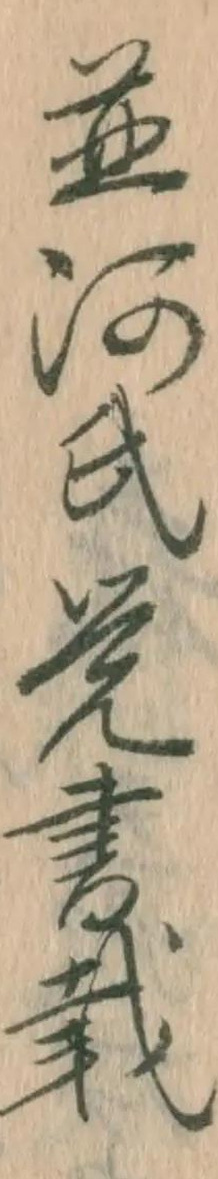並河氏覚書載
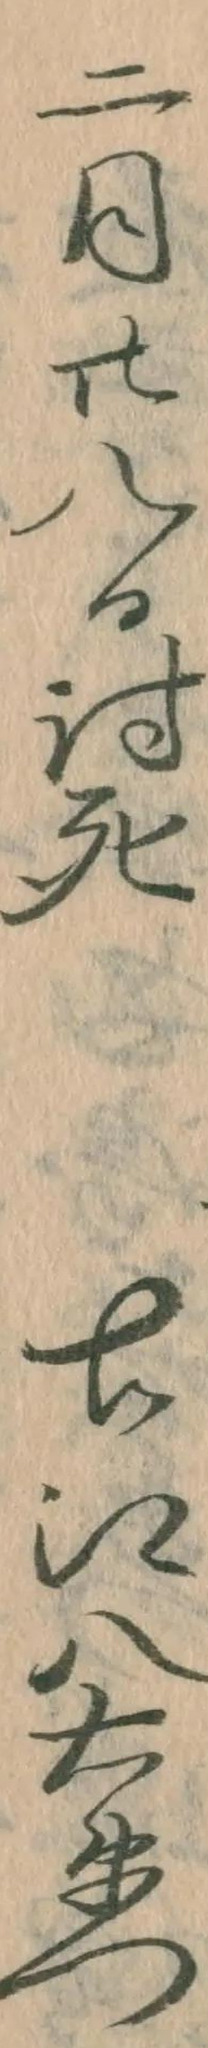二月廿八日討死古江八右衛門
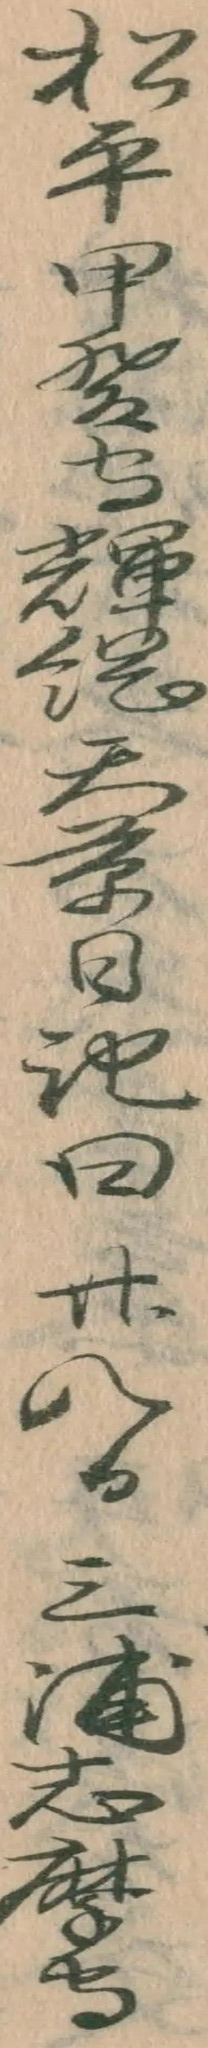松平甲斐守輝綱天草日記曰廿八日三浦志摩守
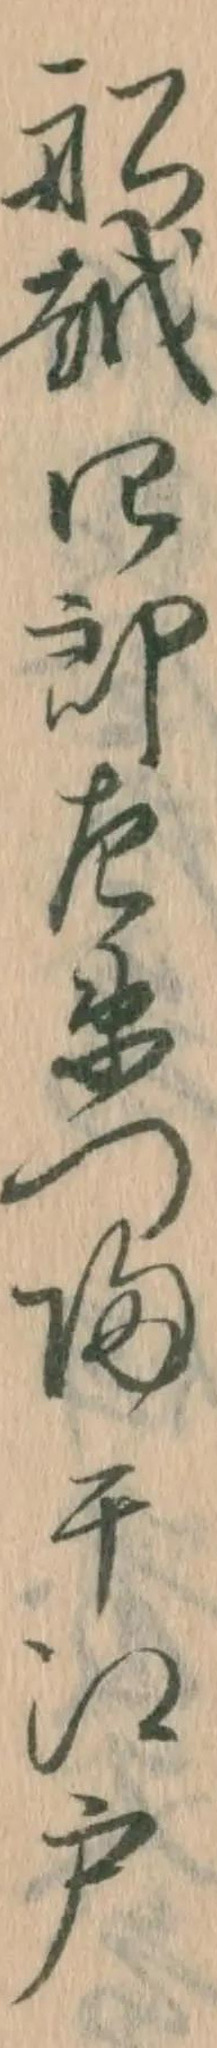舩越四郎左衛門帰干江戸
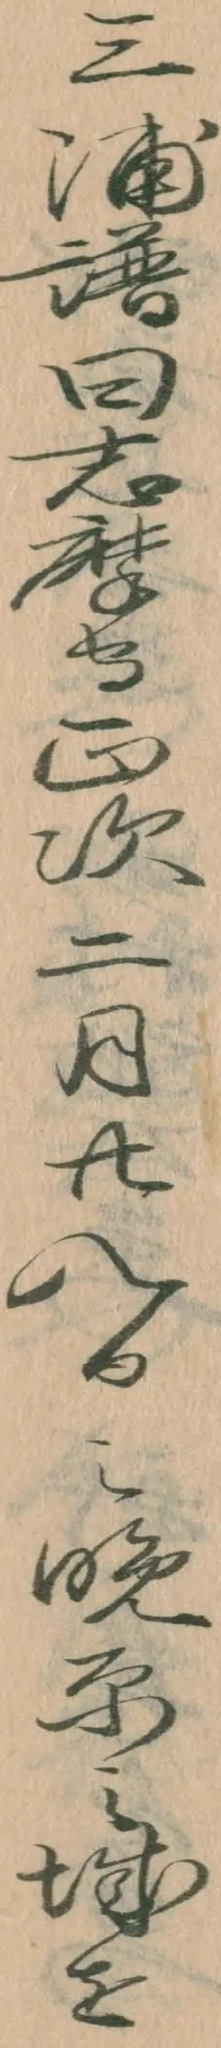三浦譜曰志摩守正次二月廿八日之晩原之城を
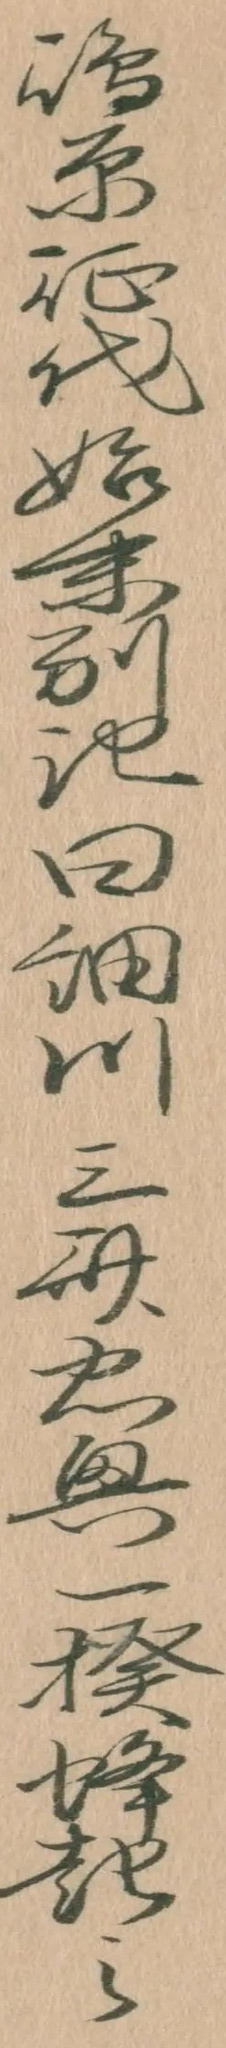島原征伐始末別記曰細川三斎忠興一揆蜂起之
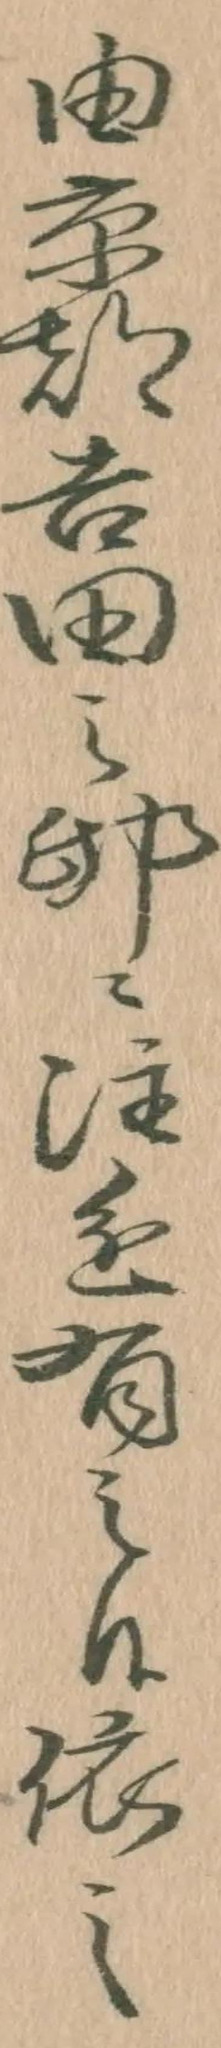由京都吉田之邸に注進有之候依之
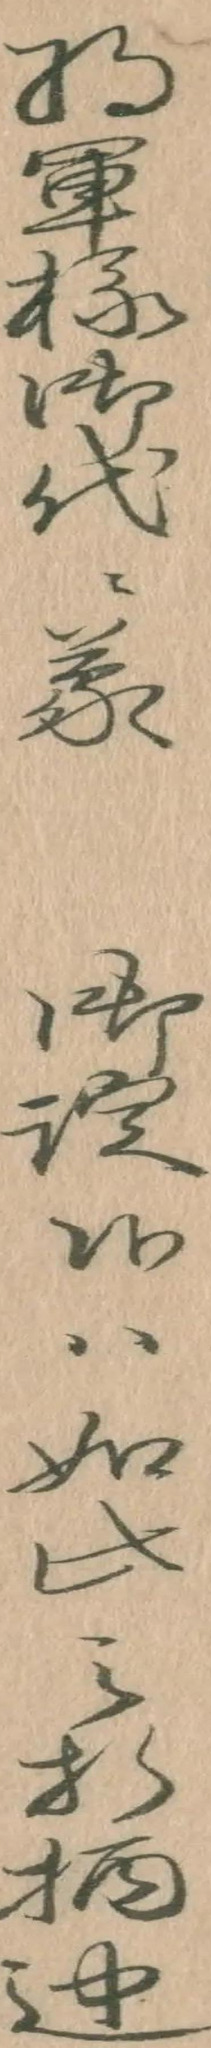将軍様御代に承御諚候は如此之折柄迚

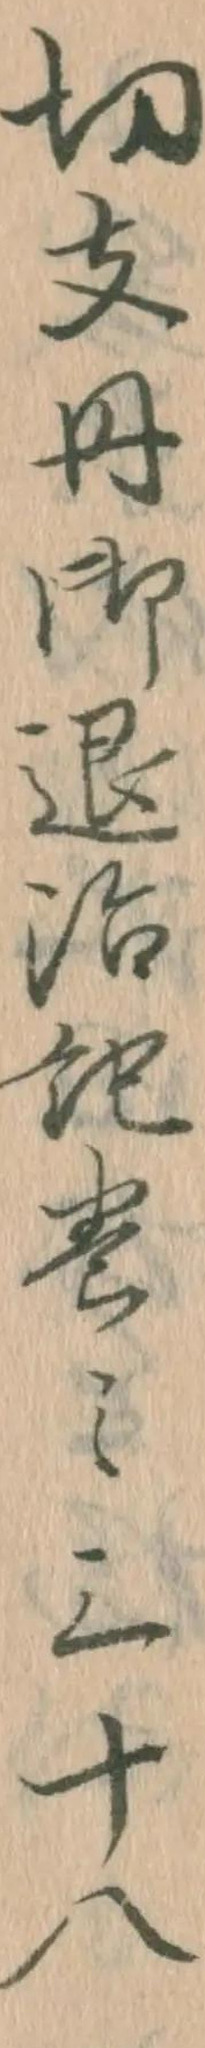切支丹御退治記巻之三十八
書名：切支丹御退治記 49巻. [9]
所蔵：国立国会図書館 National Diet Library, JAPAN
